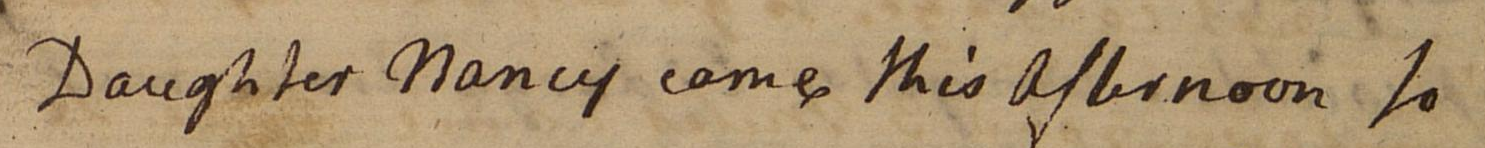Daughter Nancy came this afternoon to
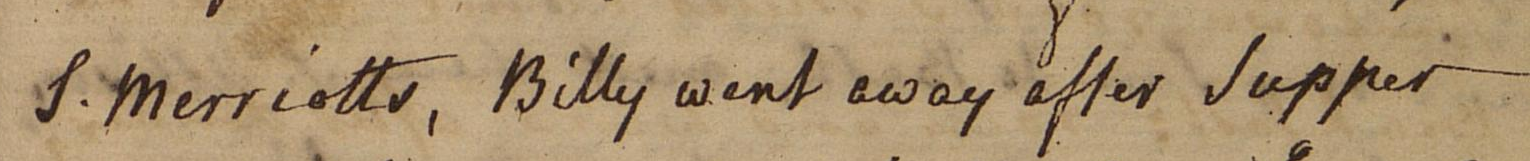S. Merriotts, Billy went away after supper
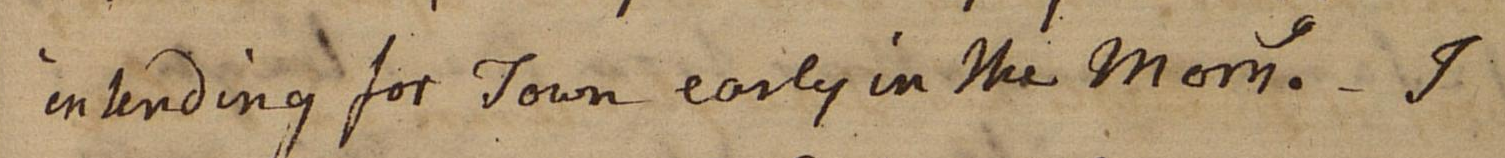intending for Town early in the Morn^g.- I
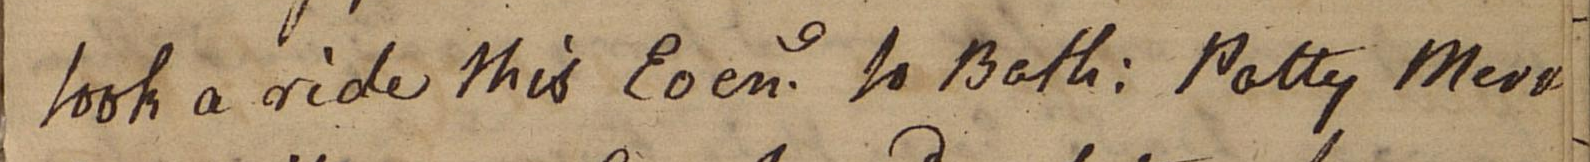took a ride this Even^g. to Bath: Patty Merr-
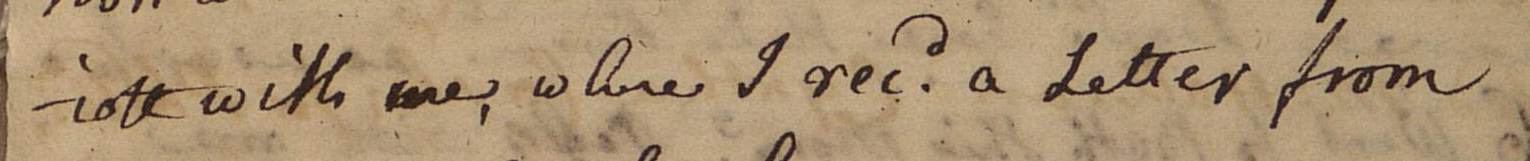-iott with me, where I rec^d. a Letter from
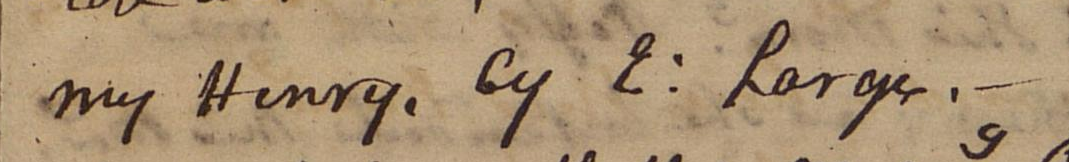my Henry, by E. Large.-
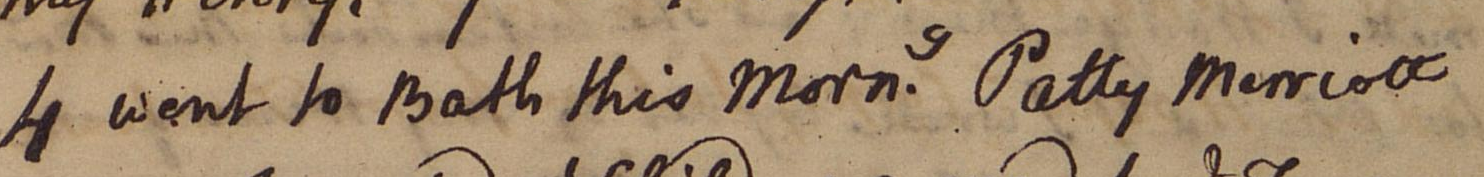4 went to Bath this Morn^g. Patty Merriott
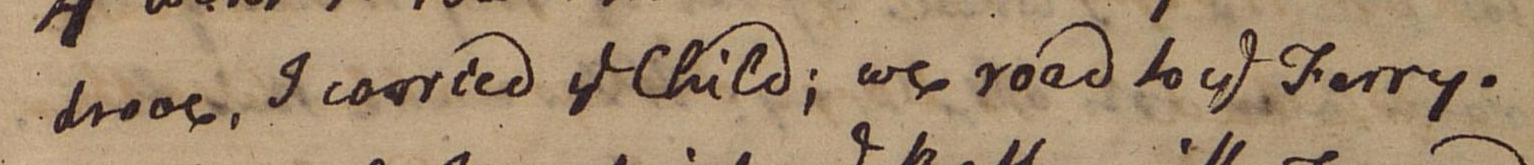drove, I carried y^e Child; we road to y^e Ferry.
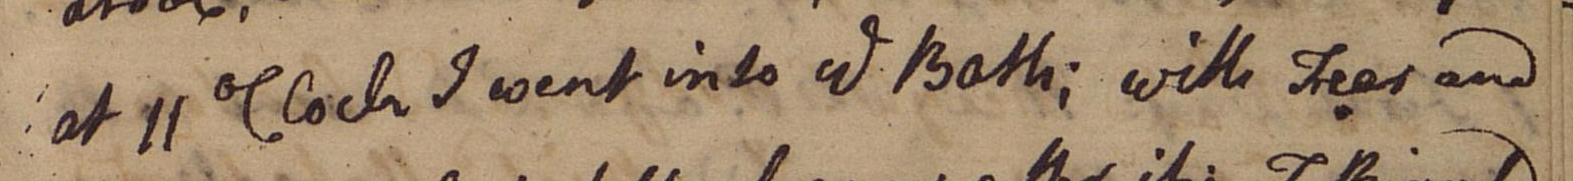at 11 ^o Clock I went into y^e Bath; with Fear and
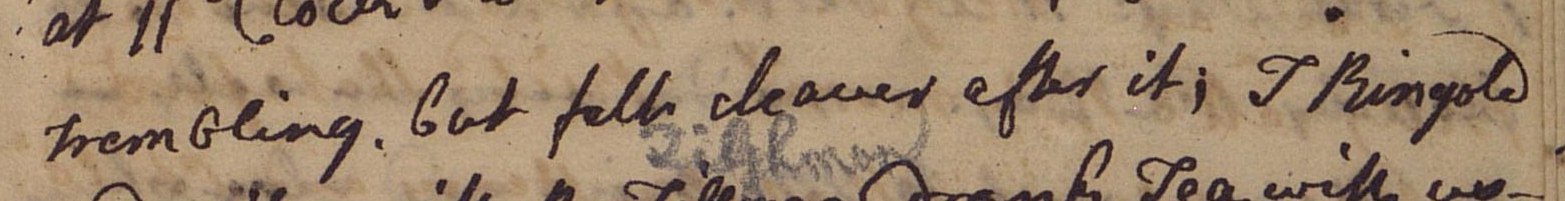trembling, but fell cleaver after it; T Ringold
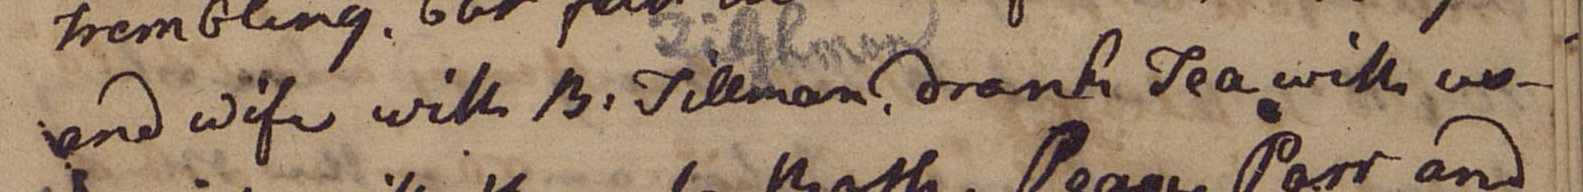and wife with B. Tillman. drank Tea with us -
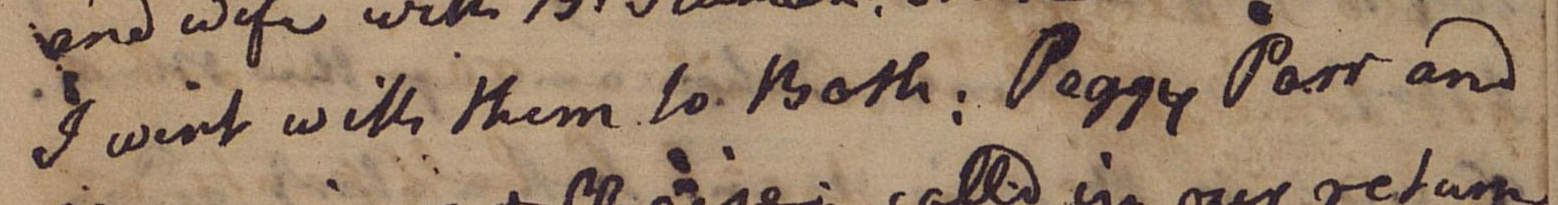I went with them to Both: Peggy Parr and
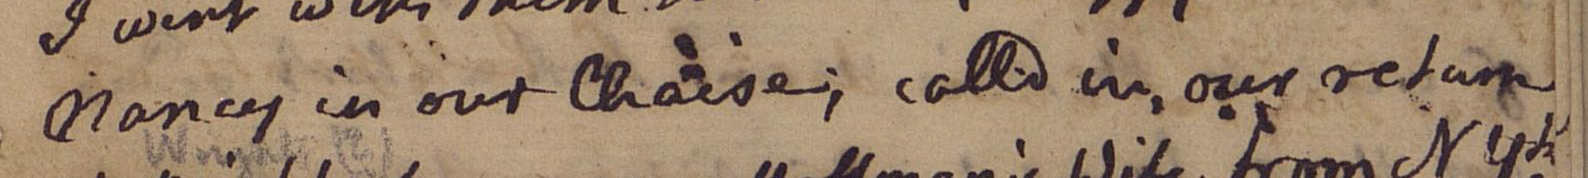Nancy in our Chaise, call'd in our return
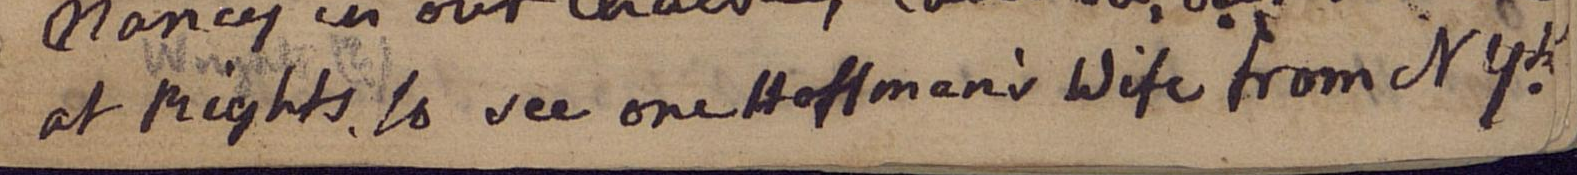at Rights to see one Hoffman's Wife from NY^k.
